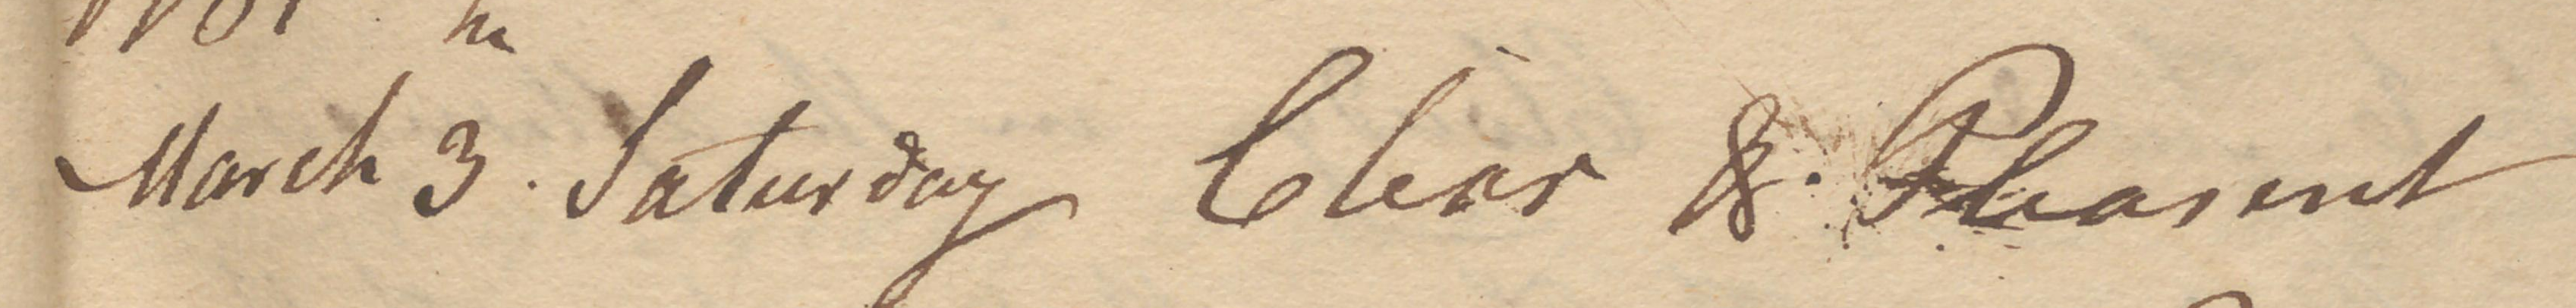March 3^th. Saturday Clear & Pleasent
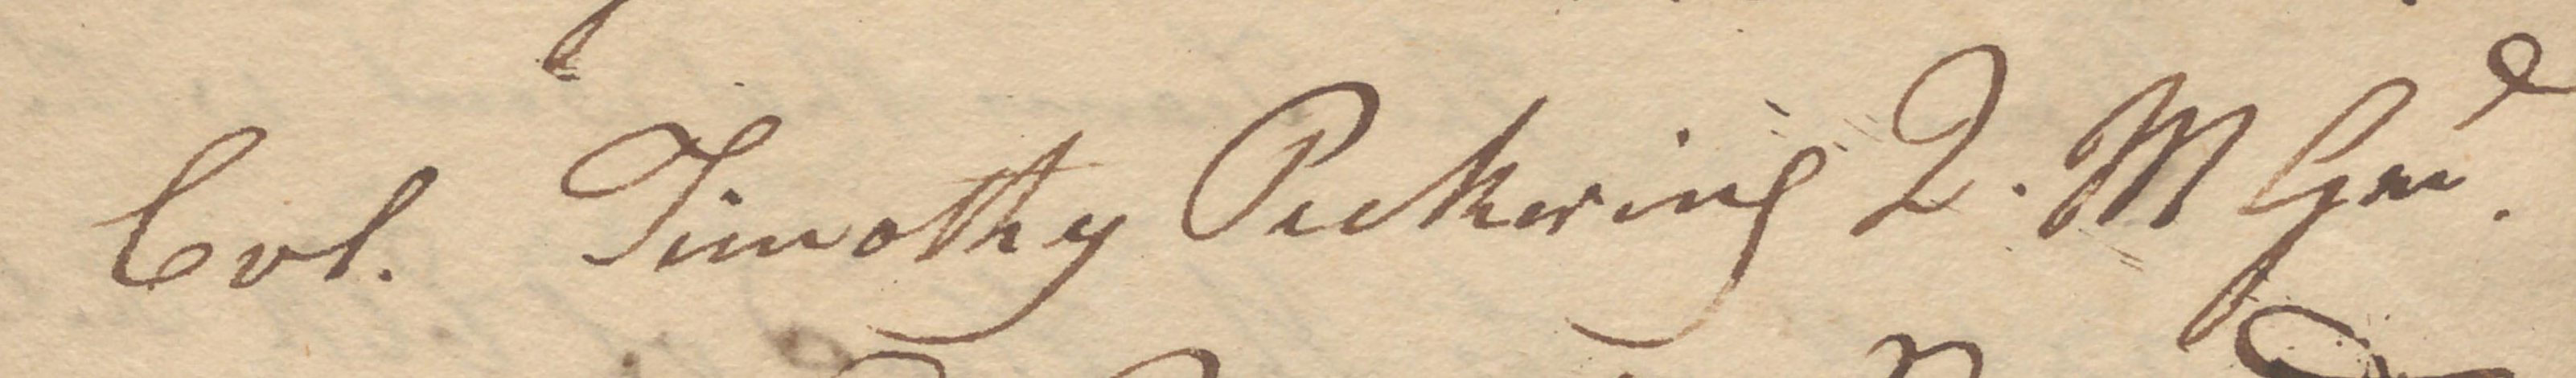Col. Timothy Pickering Q.MGen^l.
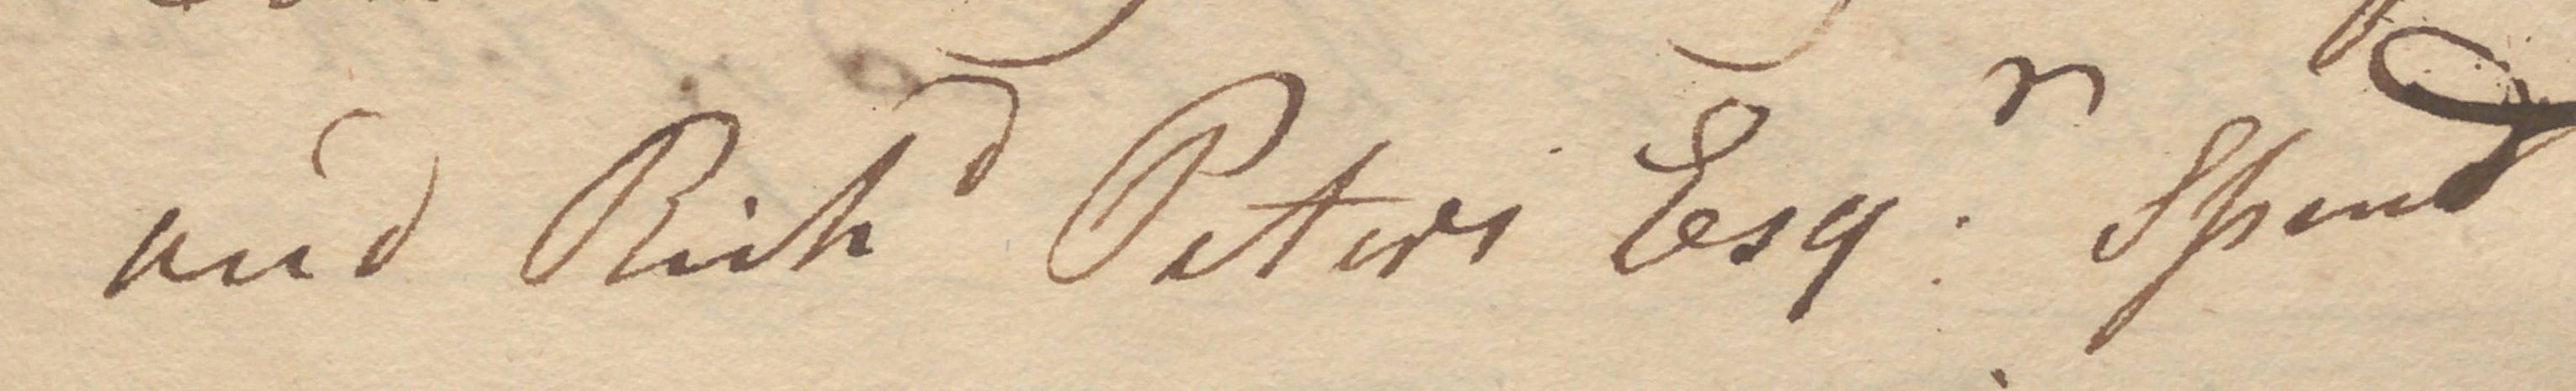and Rich^d Peters Esq^r: Spend
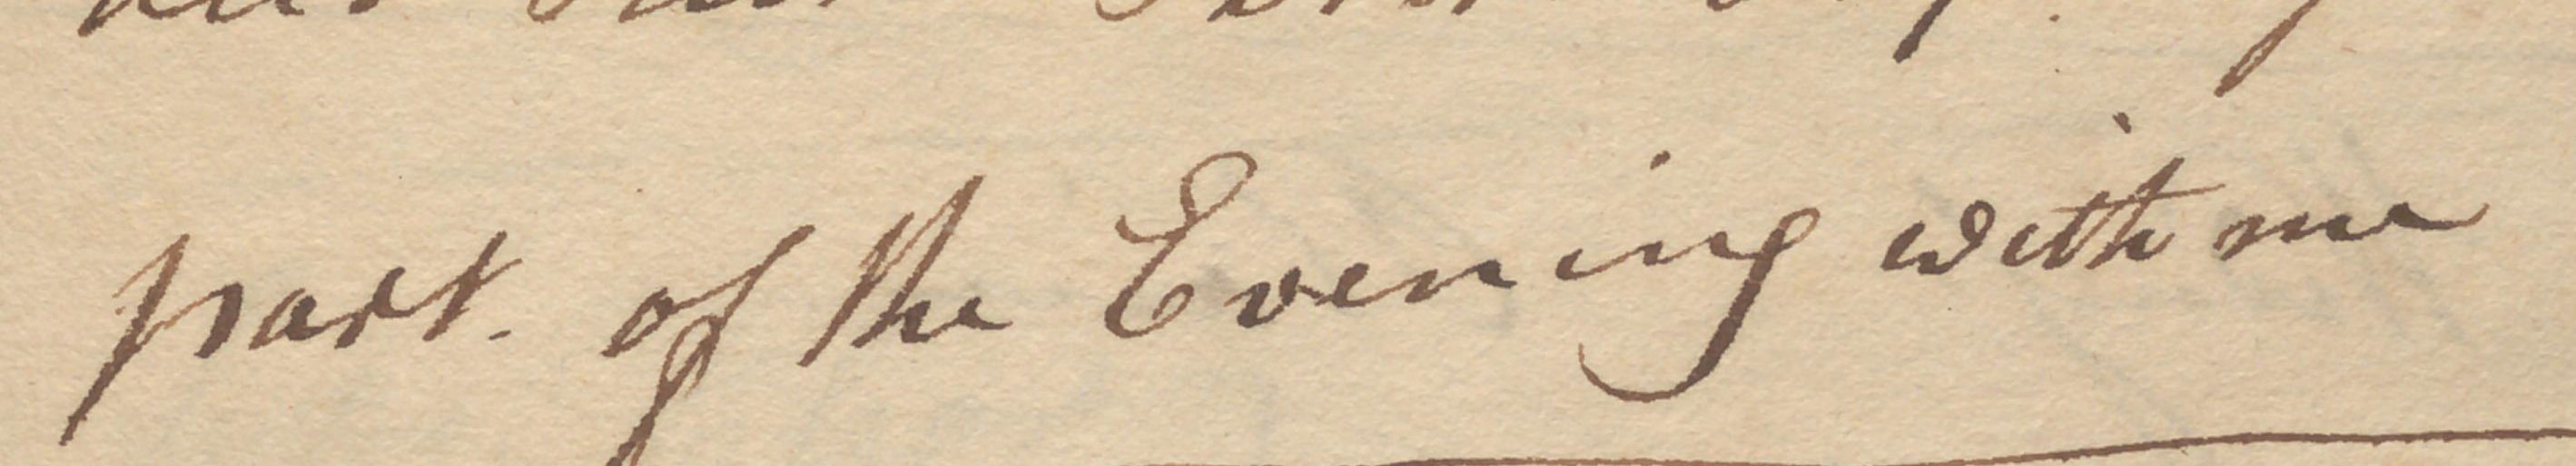part of the Evening with me
